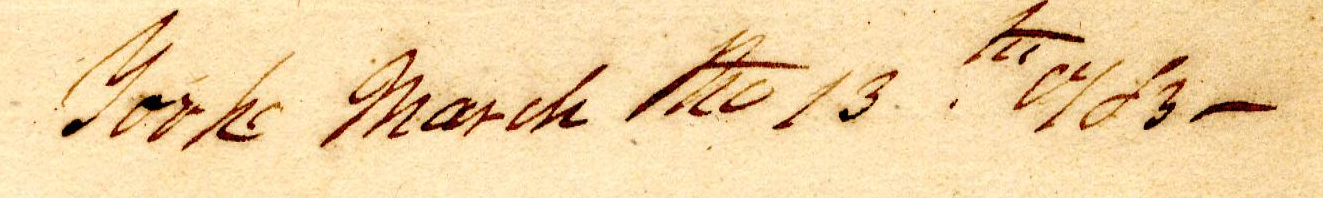York March the 13^th. 1783
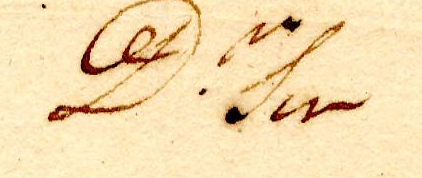D^r Sir
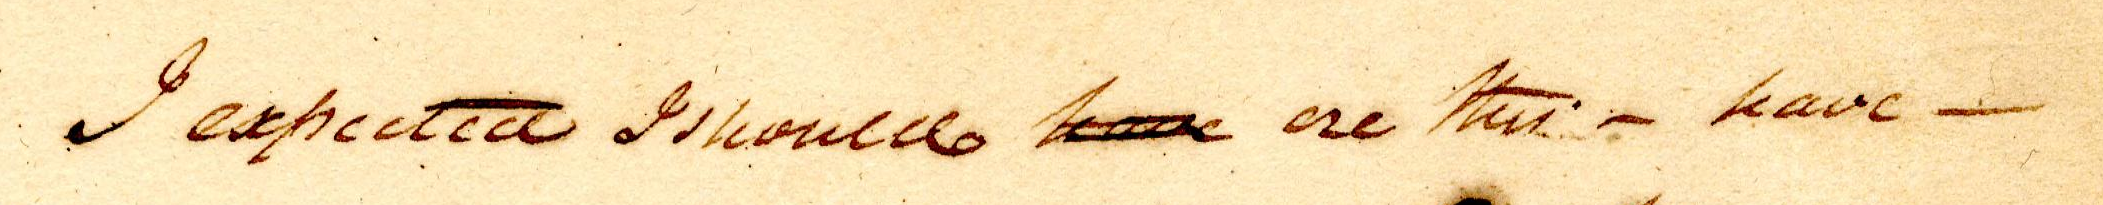I expected I should leave are thus- have
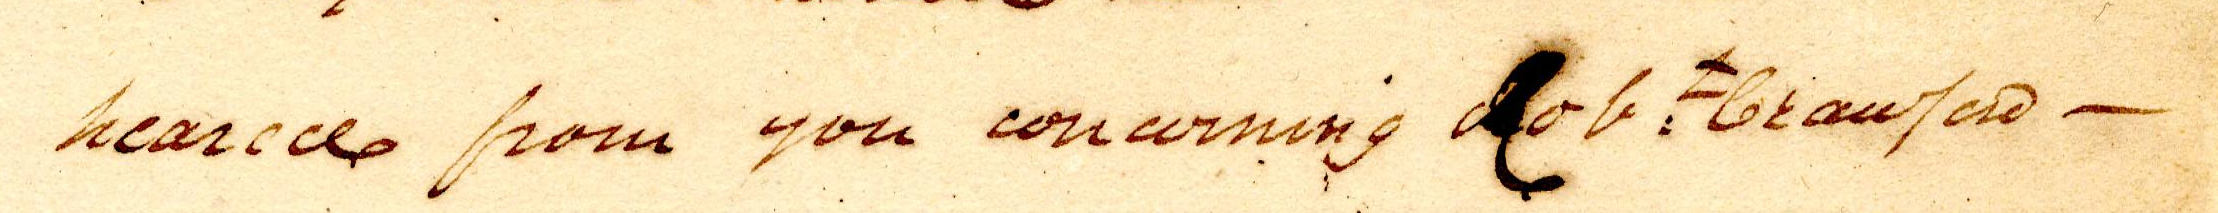heared from you concerning a Rob^t. Crawford
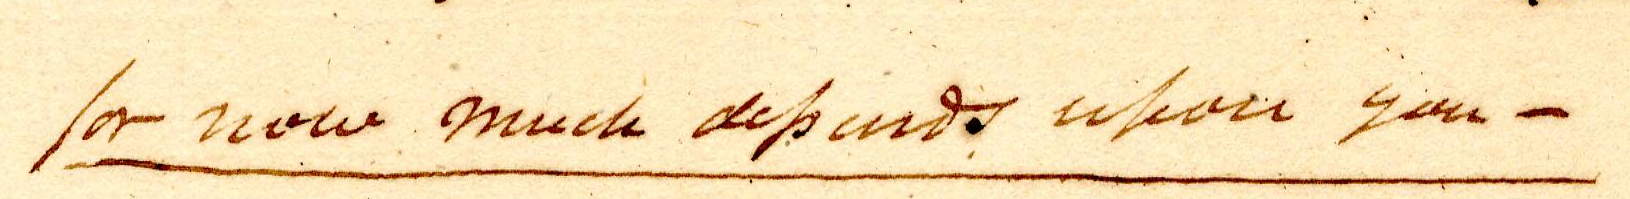for now much depends upon you.
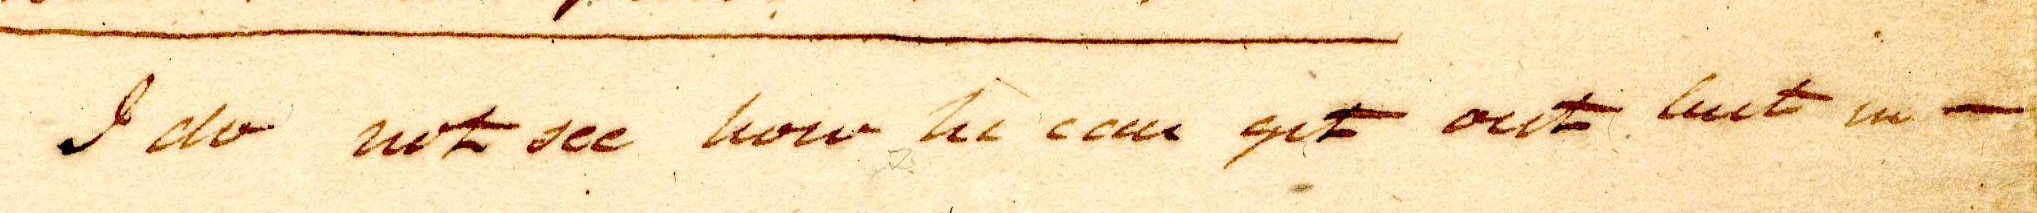I do not see how he can get out but in
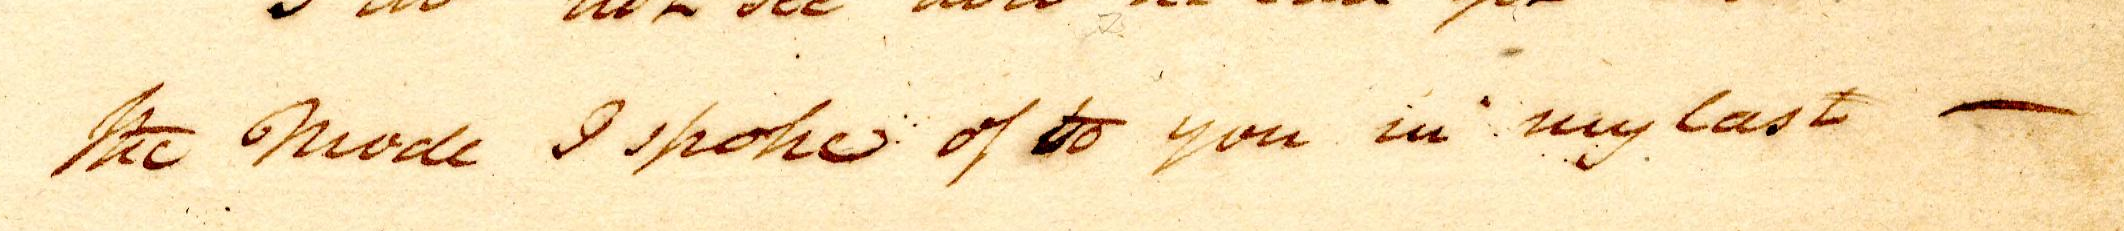the Mode I spoke of to you in my last
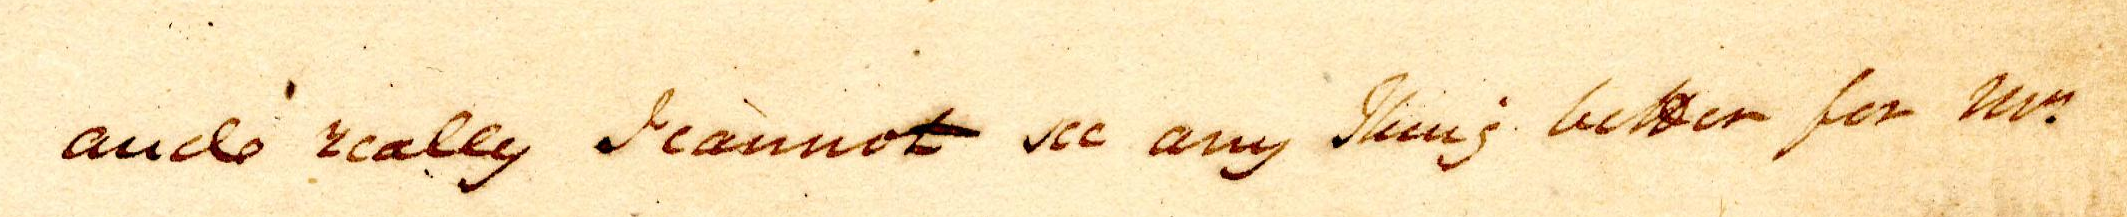and really I cannot see any thing better for M^r.
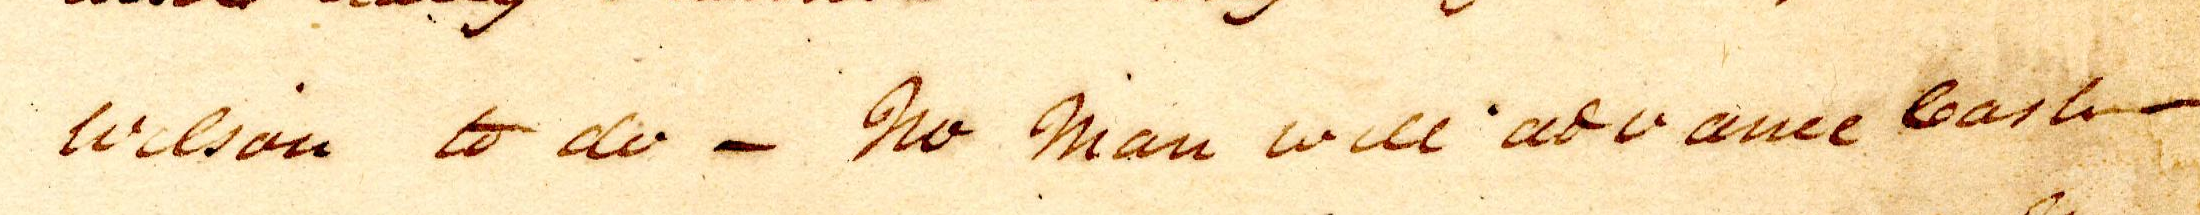Wilson to do. No man will advance Cash
